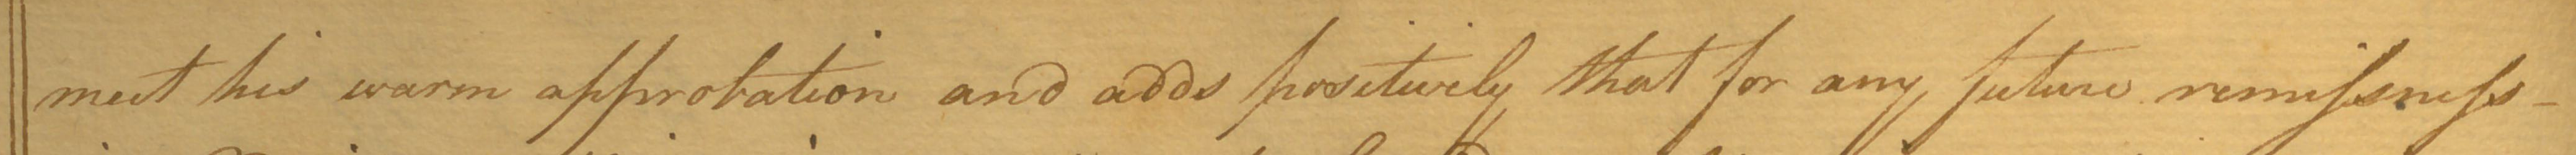meet his warm approbation and adds positively that for any future remissness
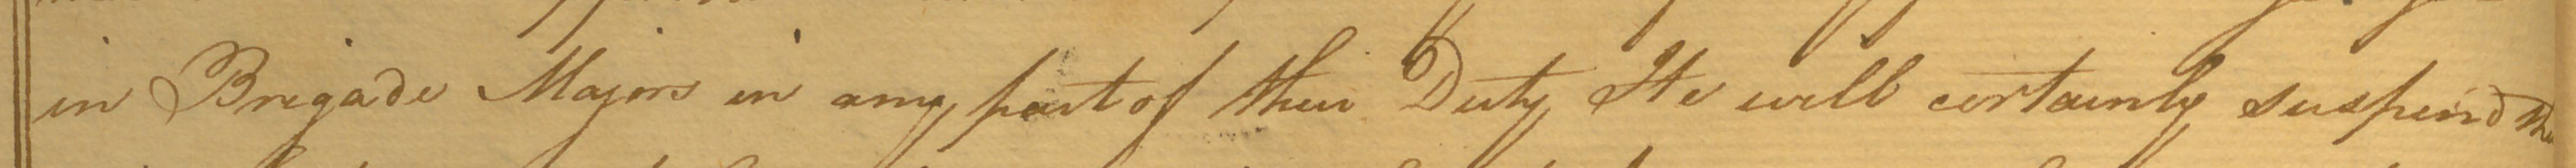in Brigade Majors in any part of their Duty He will certainly suspend th
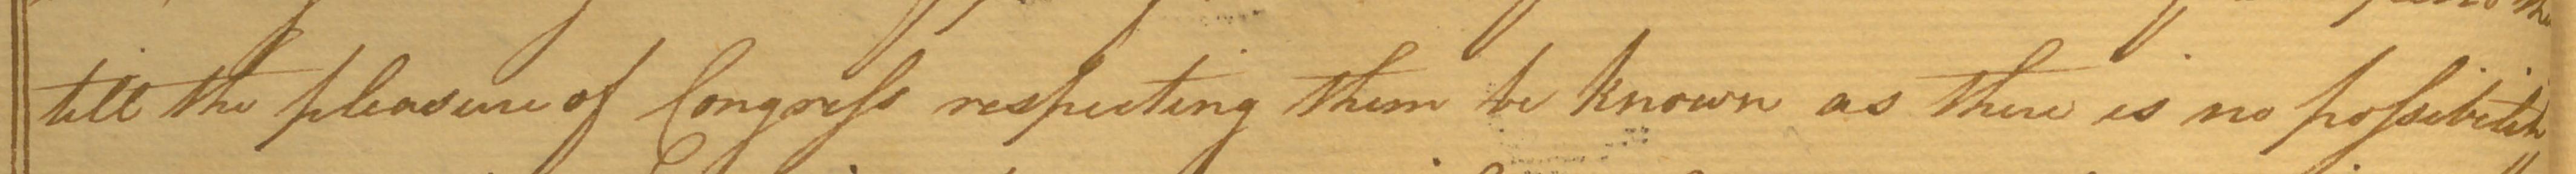till the pleasure of Congress respecting them be known as there is no possibility
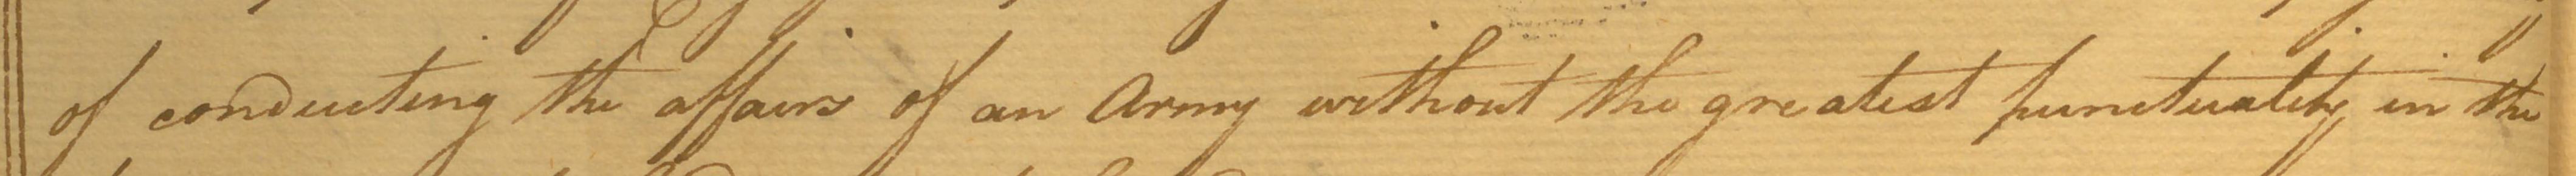of conducting the affairs of an Army without the greatest punctuality in the
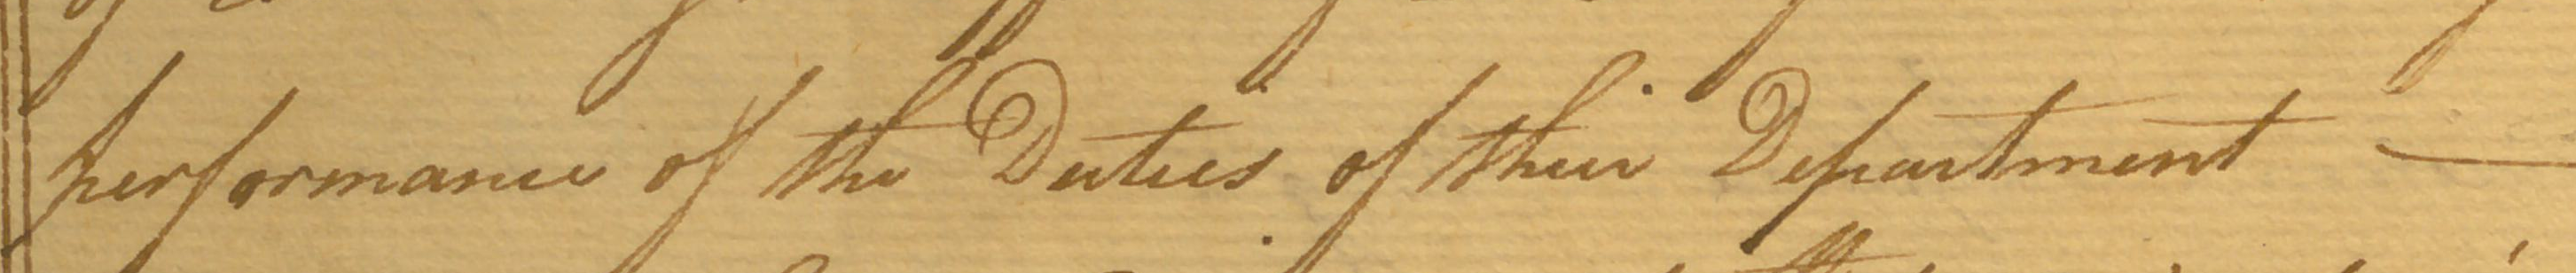performance of the Duties of their Department-
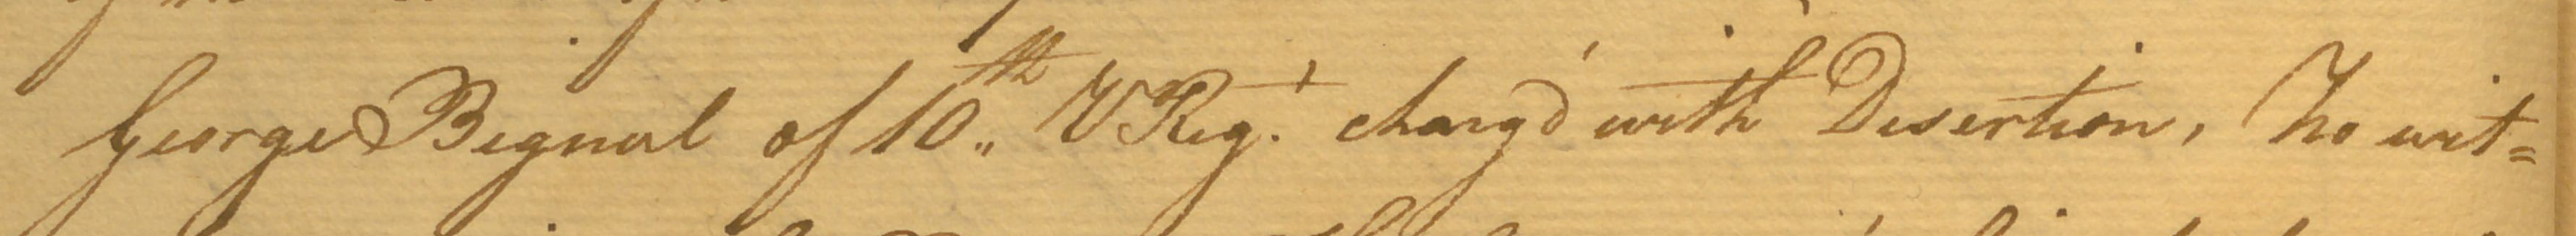George Bignal of 10^th. V Reg^t. charg'd with Desertion, No wit-
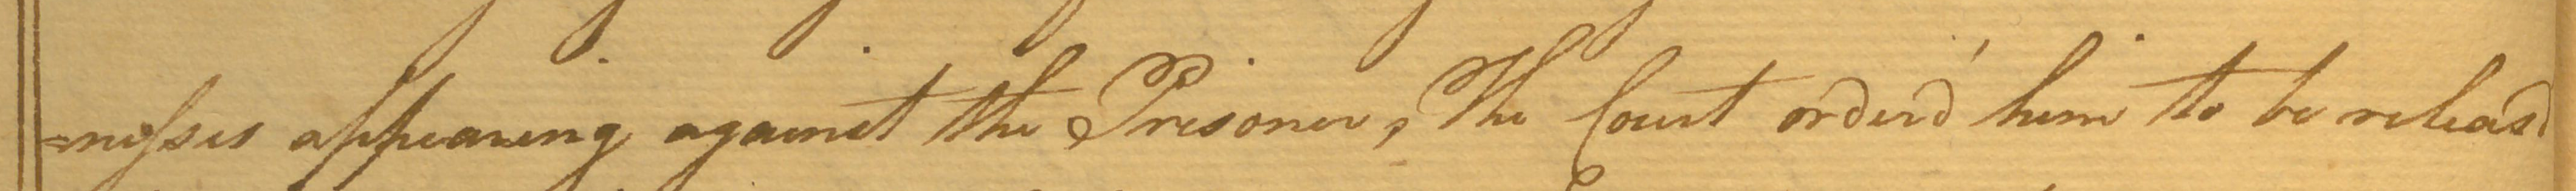nesses appearing against the Prisoner, The Court order'd him to be releasd
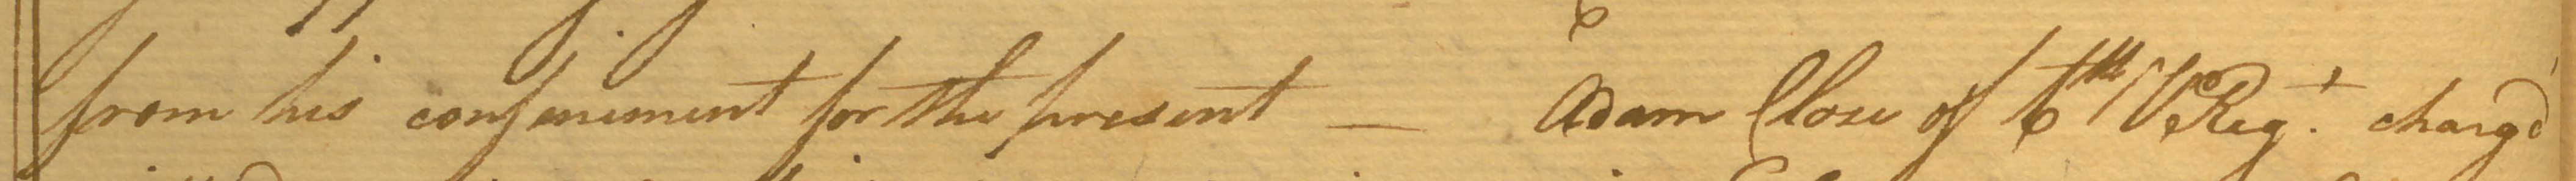from his confinement for the present- Adam Close of the 6^th V Reg^t. charg'd
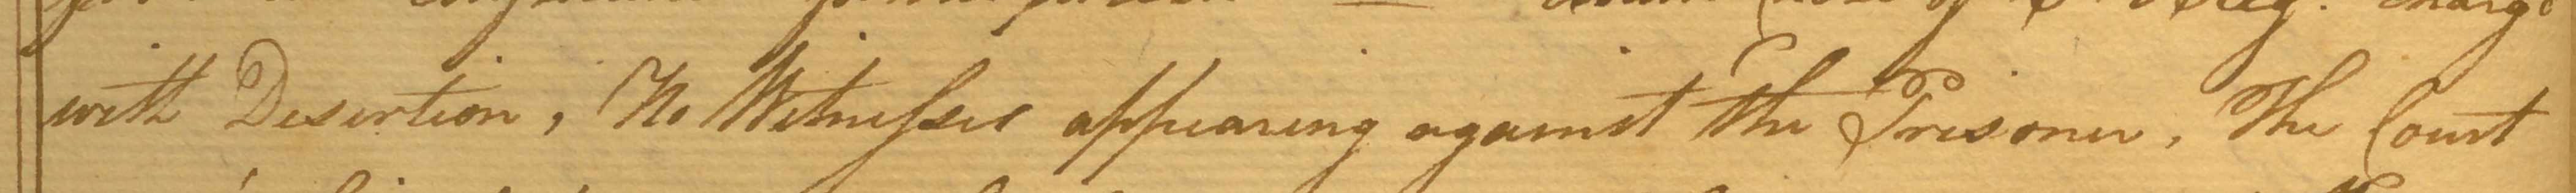with Desertion, No Witnesses appearing against the Prisoner, The Court
